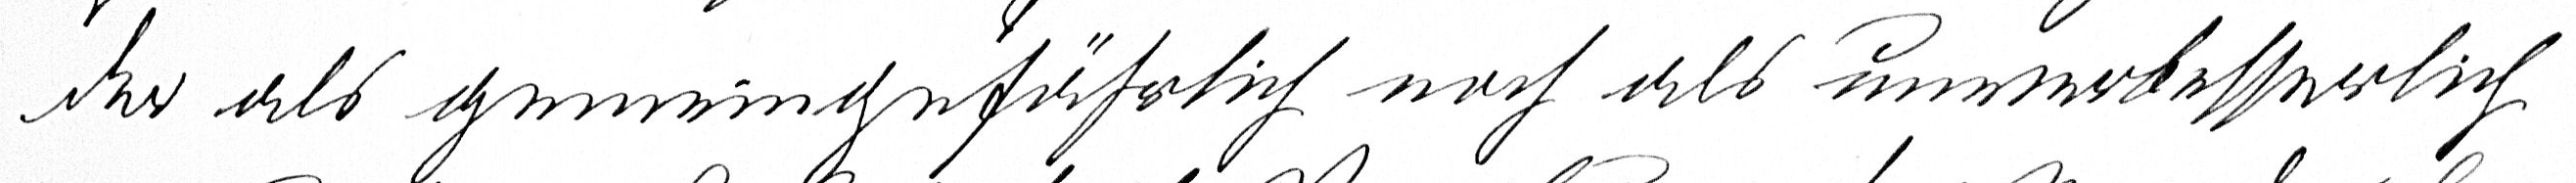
der als gemeigefährlich noch als unverbesserlich
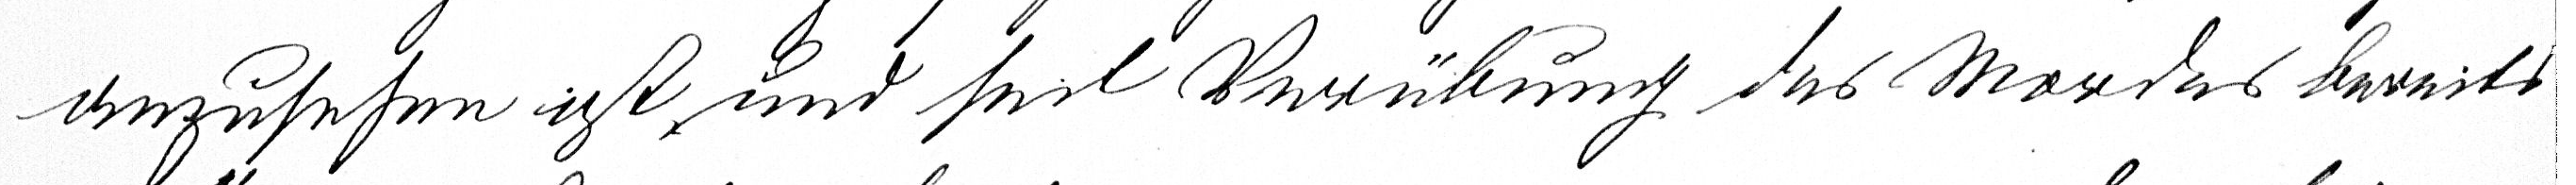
anzusehen ist und seil Verübung des Mordes bereits
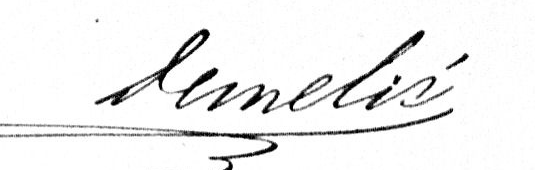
Demeli ć
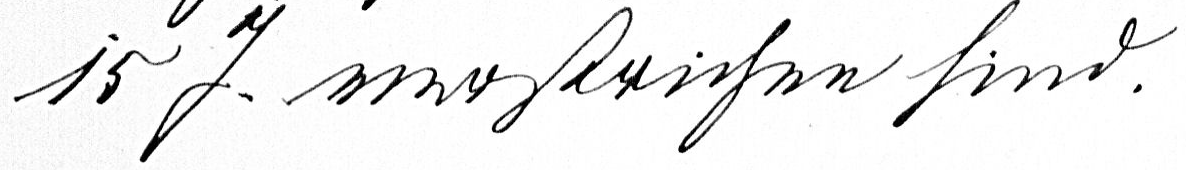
15 J. verstrichen sind.
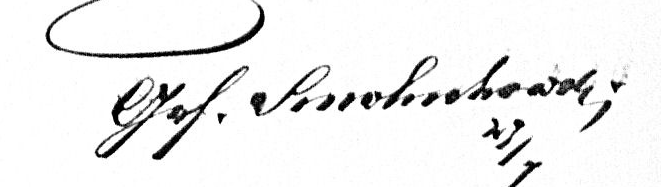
Ges. Smolnchowski
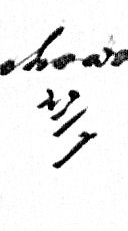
27/7
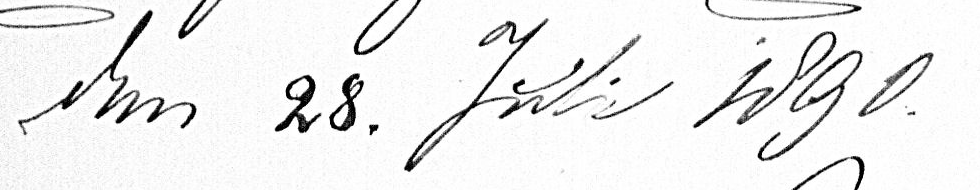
den 28. Juli 1890.
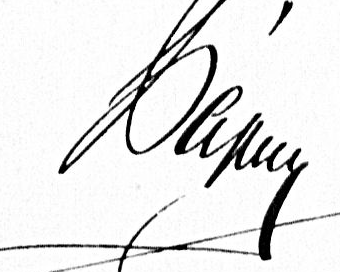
xx
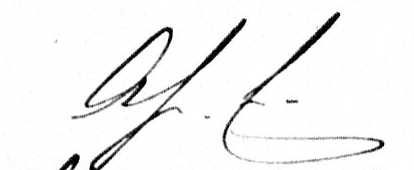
Ah. E.
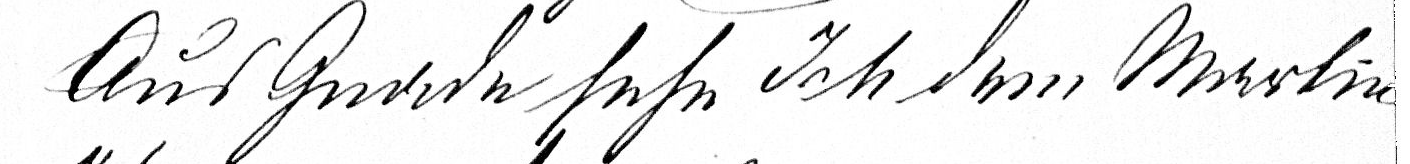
Aus Gnade sehe Ich dem Martin
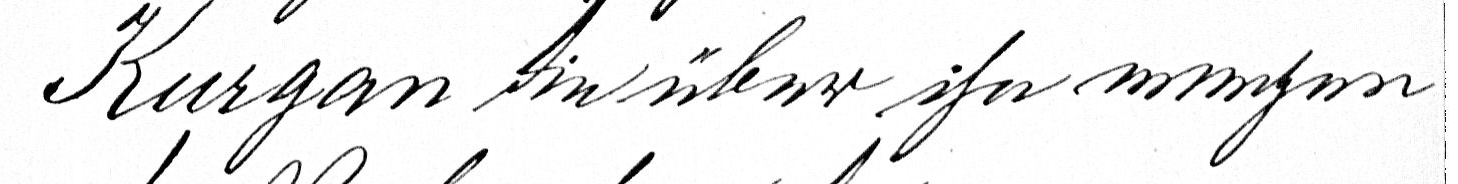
Kurgan die über ihn wegen
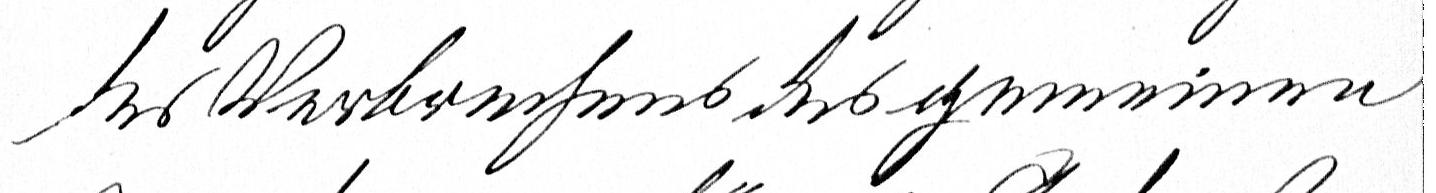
des Verbrechens des gemeinen
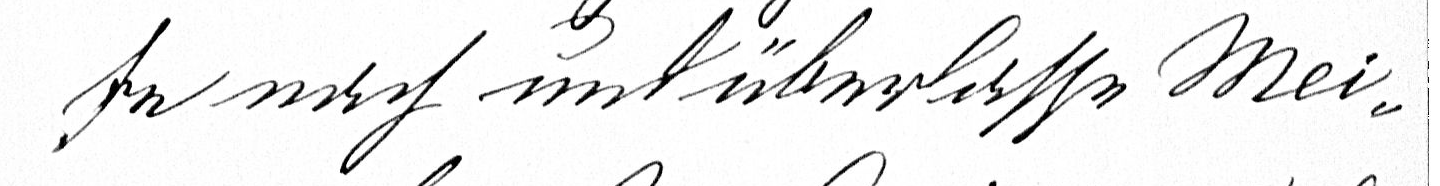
fe nach und überlasse Mei¬
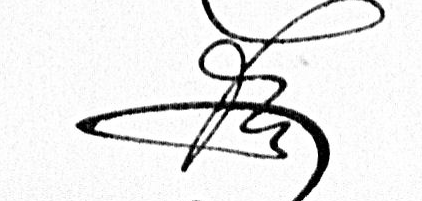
xx
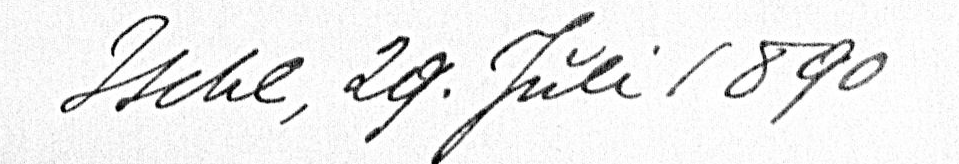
Ischl, 29. Juli 1890
